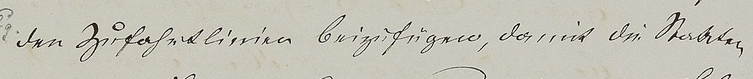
den Zufahrtlinien beizufügen, damit die Staaten
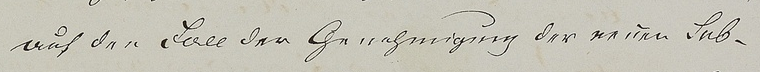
auf den Fall der Genehmigung der neuen Sub-
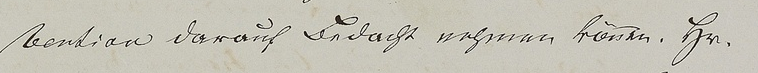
vention darauf Bedacht nehmen können. Hr.
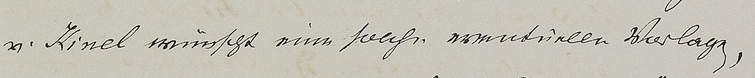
v. Kinel wünscht eine solche eventuelle Vorlage,
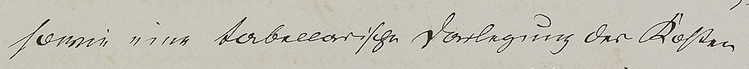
sowie eine tabellarische Darlegung der Kosten
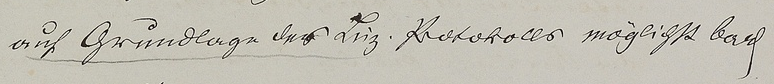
auf Grundlage des Luz. Protokolls möglichst bald
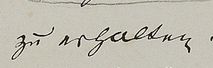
zu erhalten. –
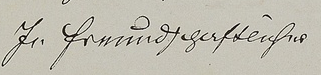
In freundschaftlicher
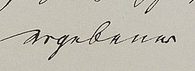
ergebener
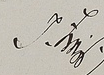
J.
